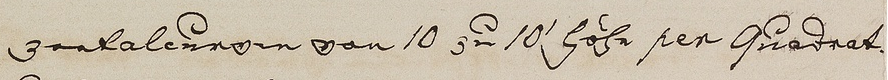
zontalcurven von 10 zu 10' Höhe per Quadrat-
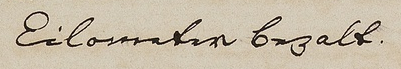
kilometer bezalt.
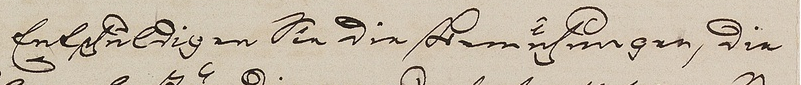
Entschuldigen Sie die Bemühungen, die
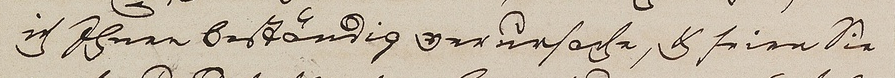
ich Ihnen beständig verursache, & seien Sie
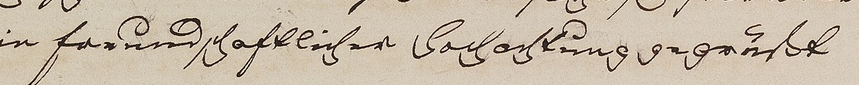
in freundschaftlicher Hochachtung gegrüßt
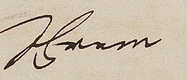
Ihrem
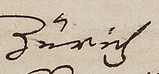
Zürich
